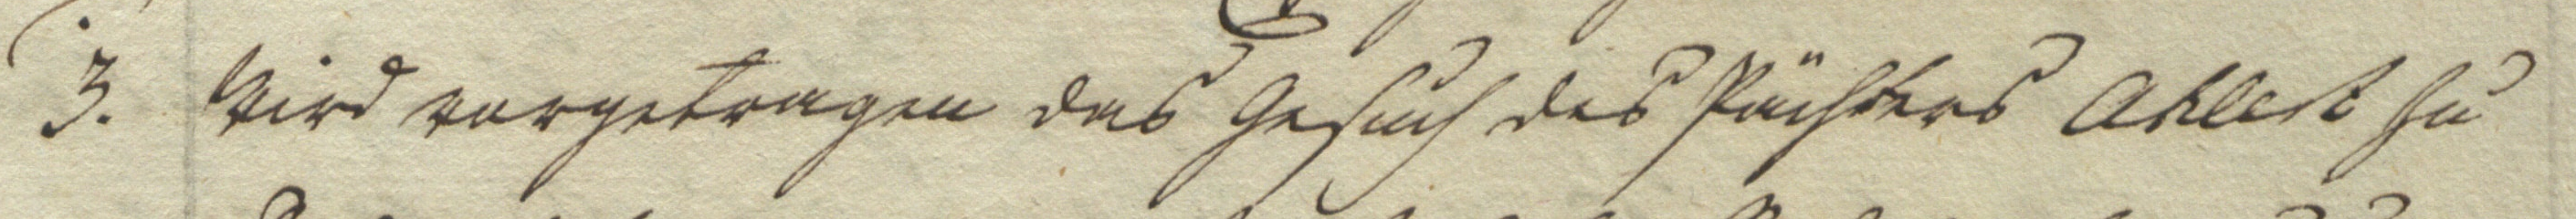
3. Wird vorgetragen das Gesuch des Pächters Ahlert zu
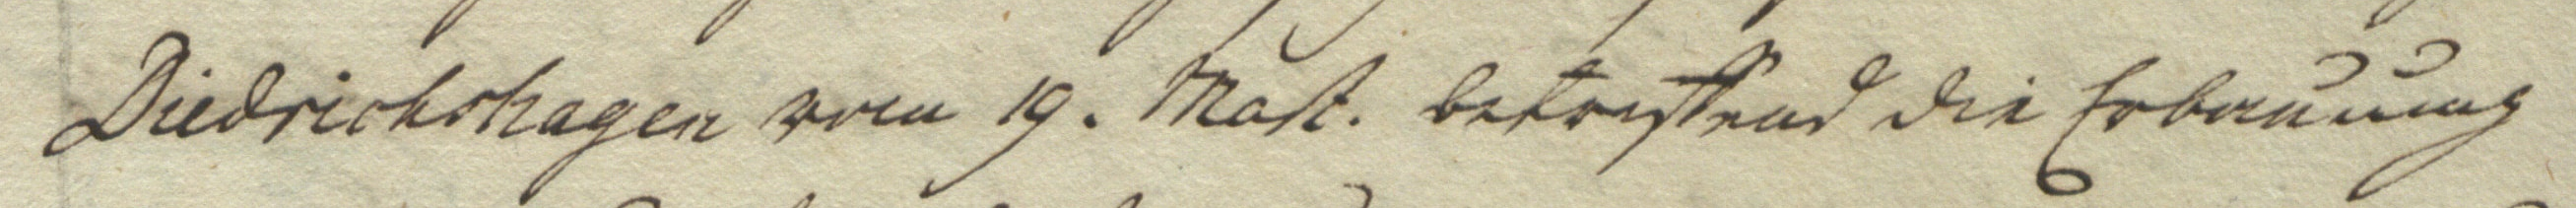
Diedrichshagen vom 19. Mart. betreffend die Erbauung
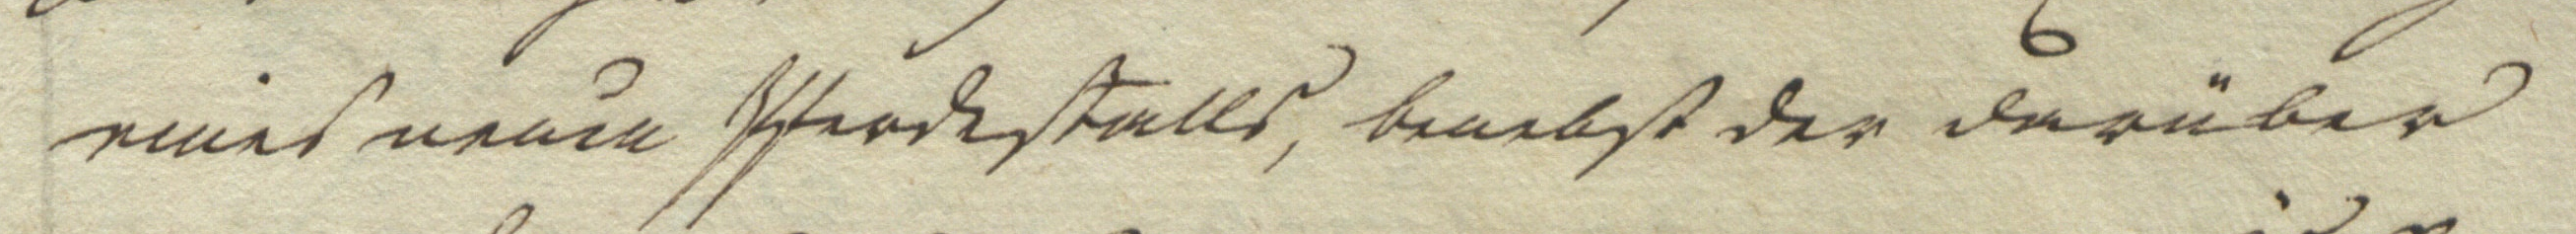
eines neuen Pferdestalls, benebst der darüber
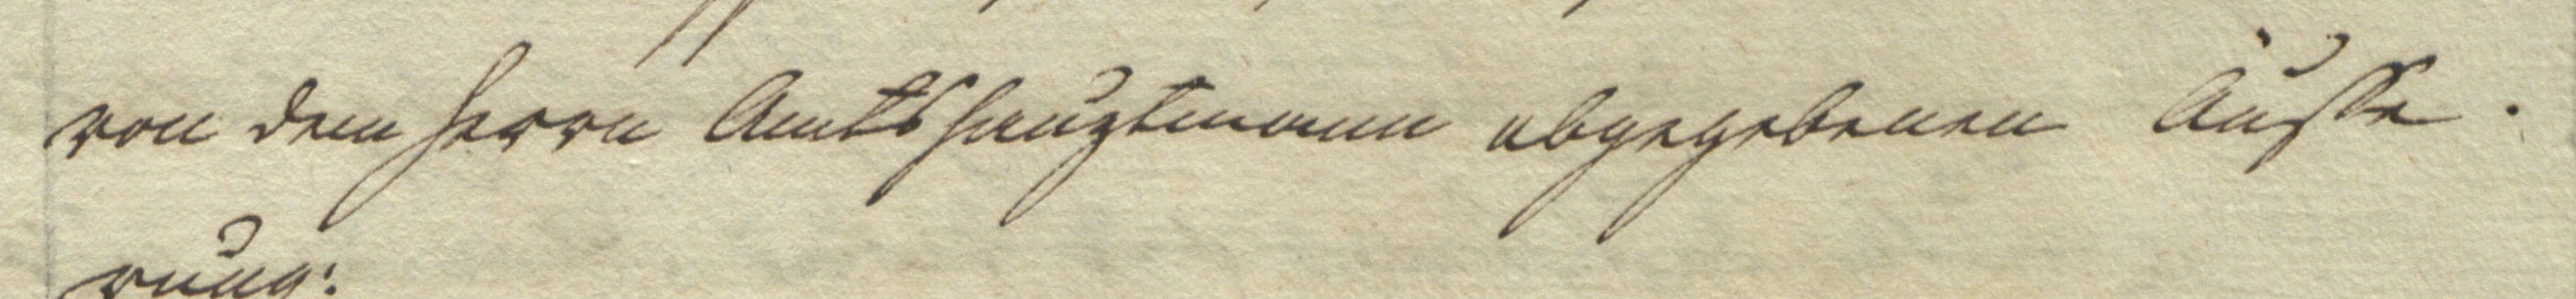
von dem Herrn Amtshauptmann abgegebenen Äusse¬
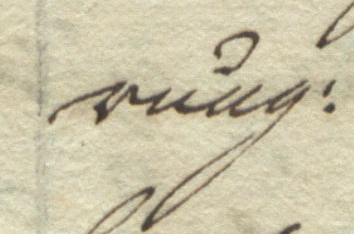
rung:
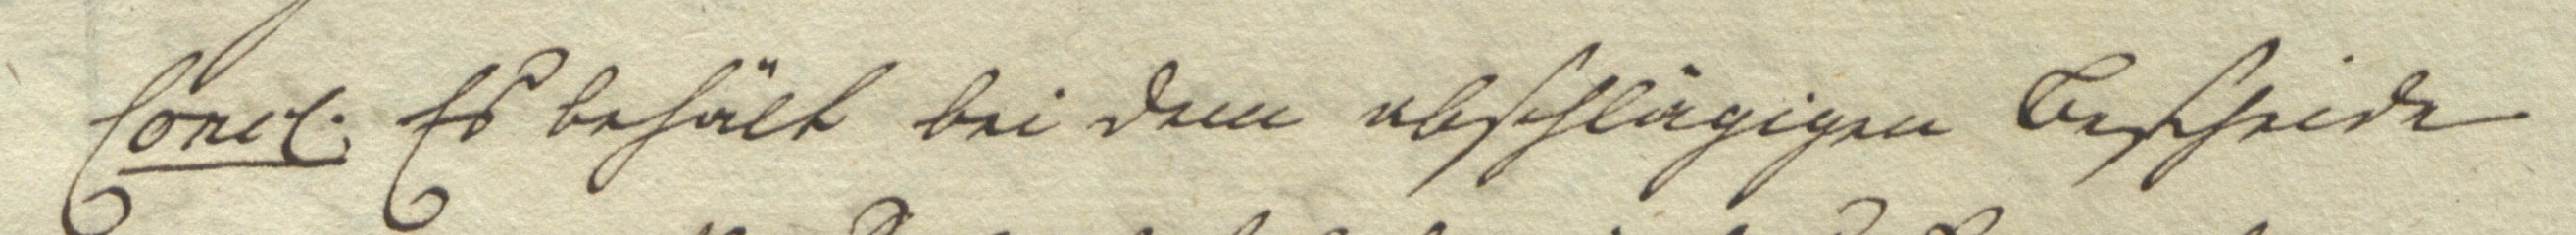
Concl. Es behält bei dem abschlägigen Bescheide
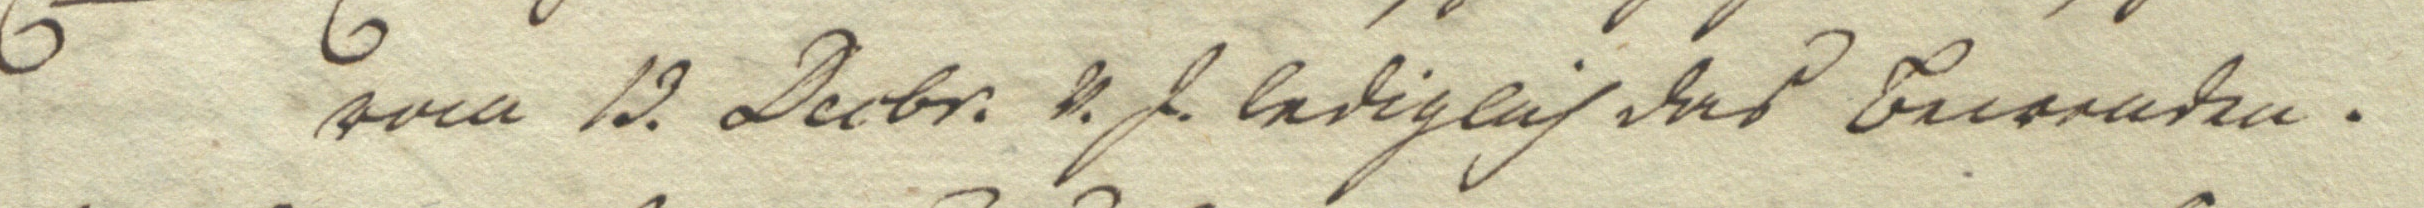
vom 13. Decbr. v. J. lediglich das Bewenden.
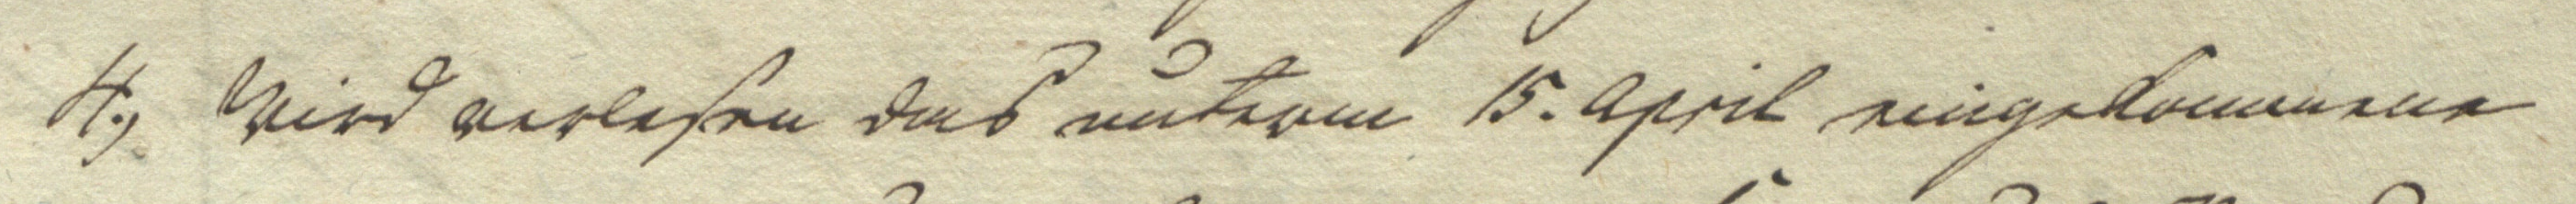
4., Wird verlesen das unterm 15. April eingekommene
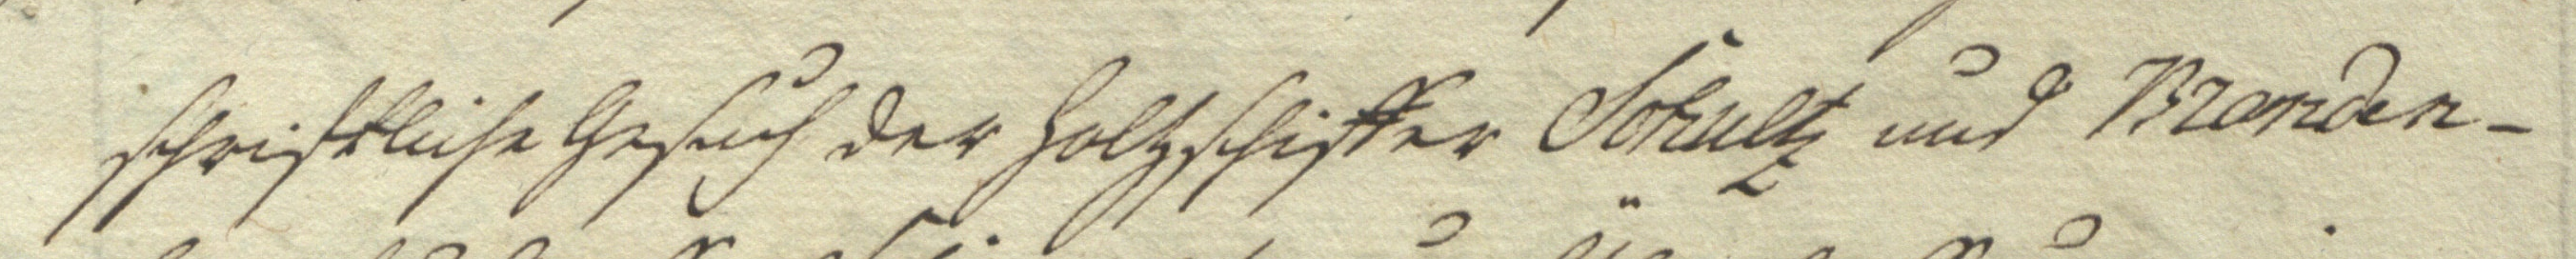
schriftliche Gesuch der Holzschiffer Schultz und Branden¬
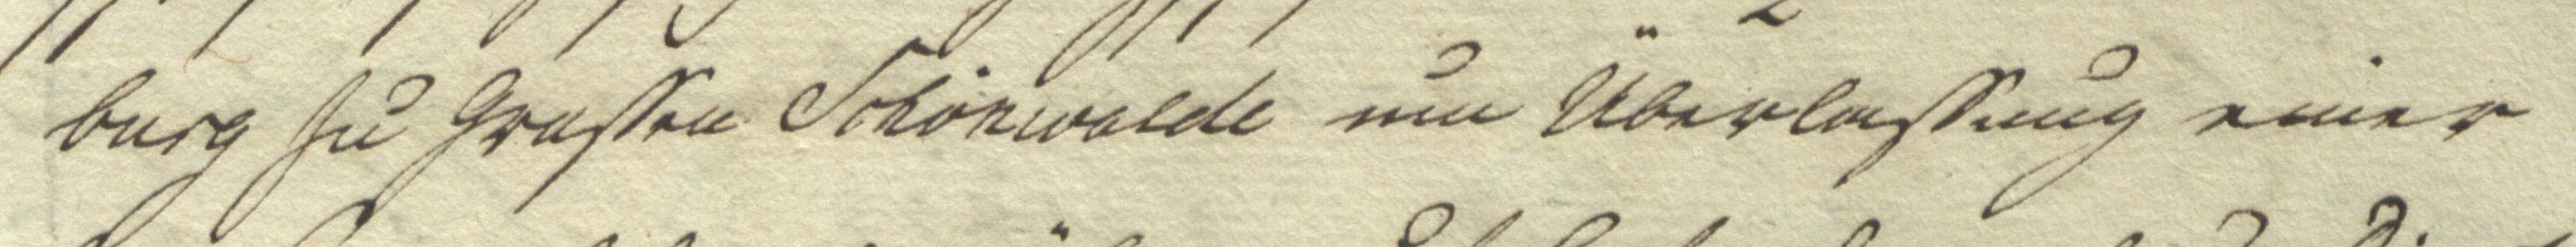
burg zu Grossen Schönwalde um Überlassung einer
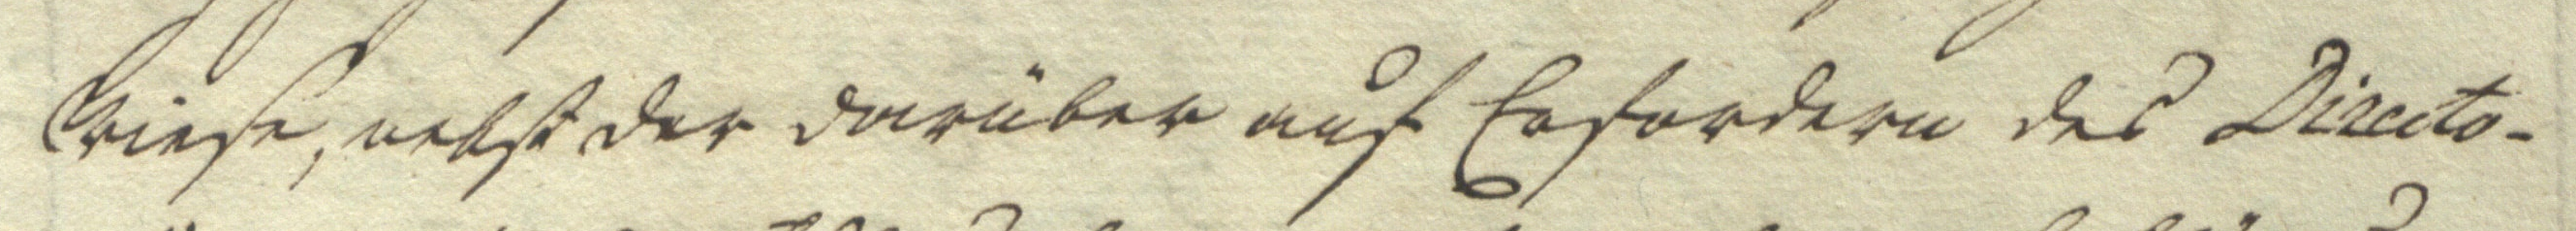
Wiese, nebst der darüber auf Erfordern des Directo¬
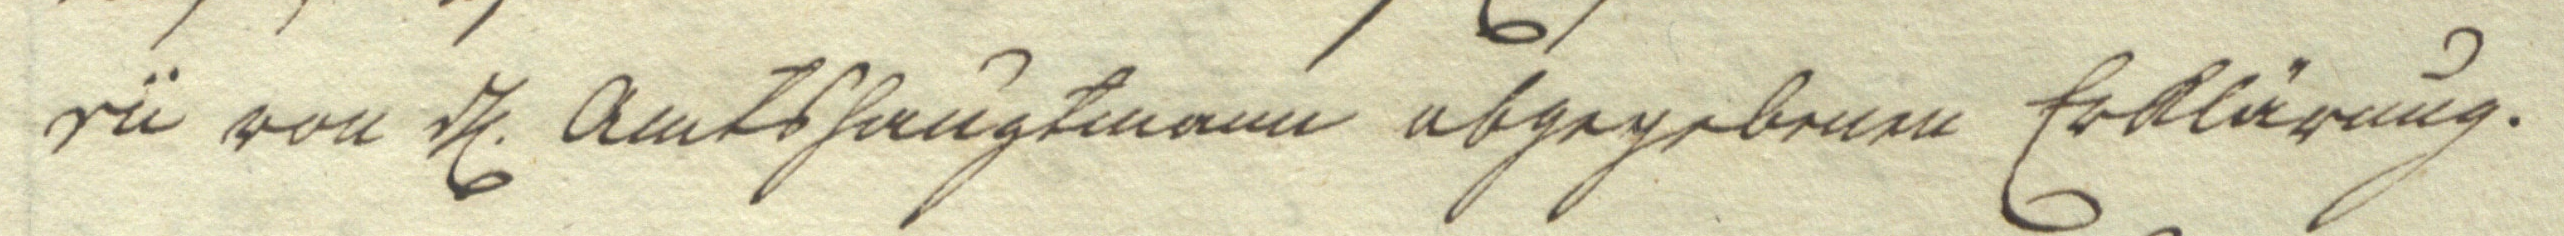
rii von dh. Amtshauptmann abgegebenen Erklärung.
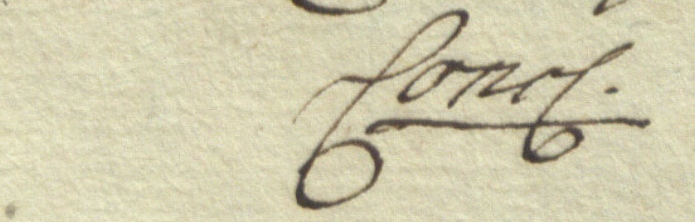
Concl.
